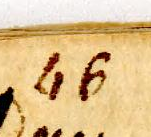46
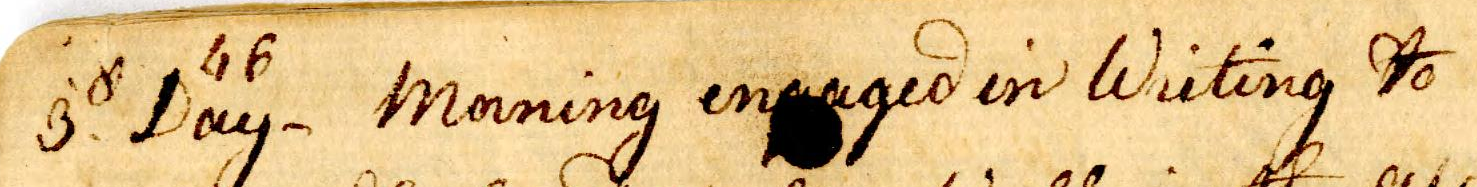3^d Day- morning engaged in Writing to
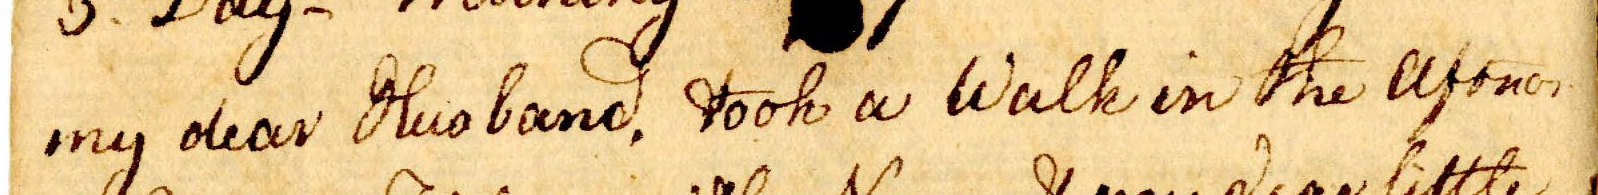my dear Husband, took a Walk in the Aftnor
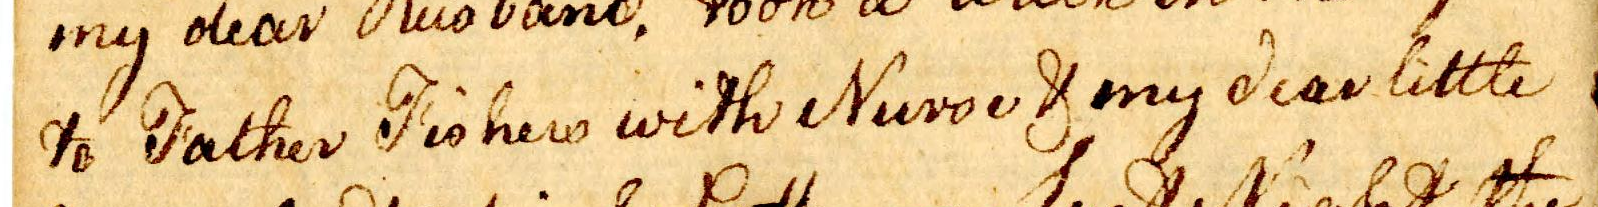to Father Fishers with Nurse & my dear little
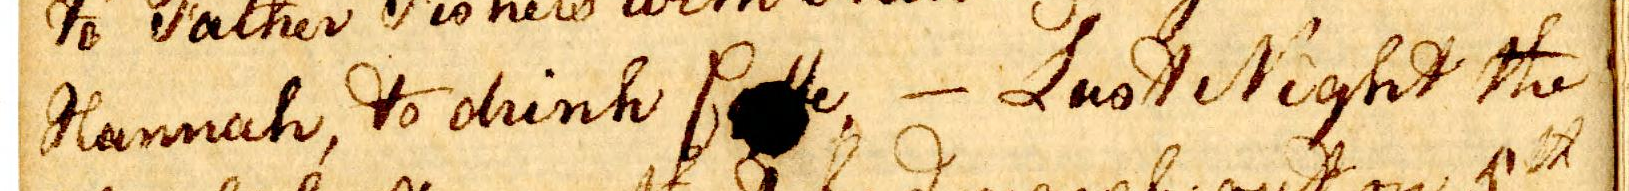Hannah, to drink Coffe,- Last Night the
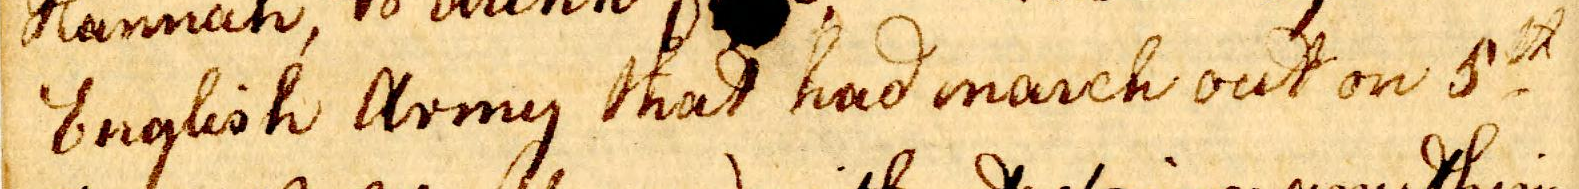English Army that had march out on 5^th
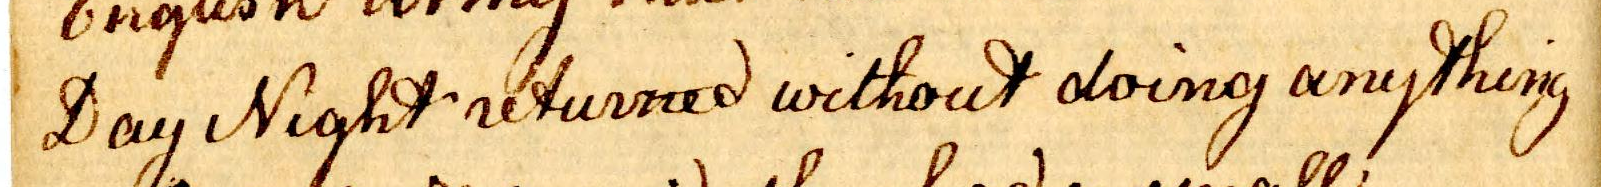Day Night returned without doing anything
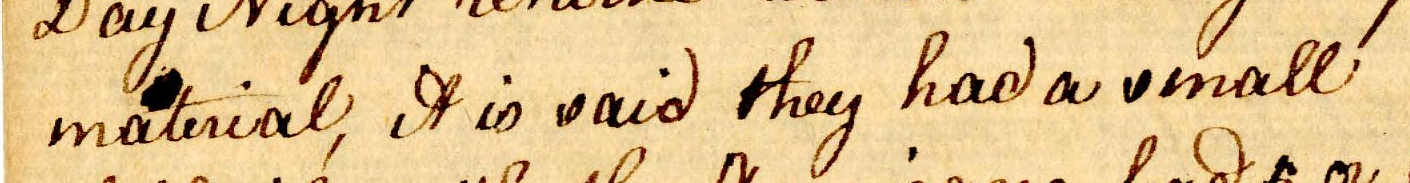material, it is said they had a small
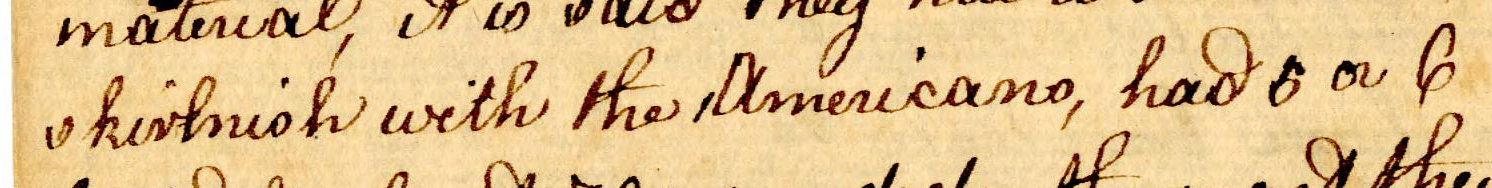skirlnish with the Americans, had 5 or 6
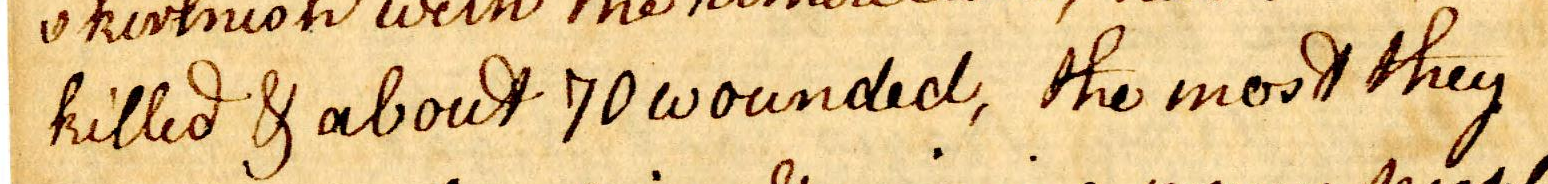killed & about 70 wounded, the most they
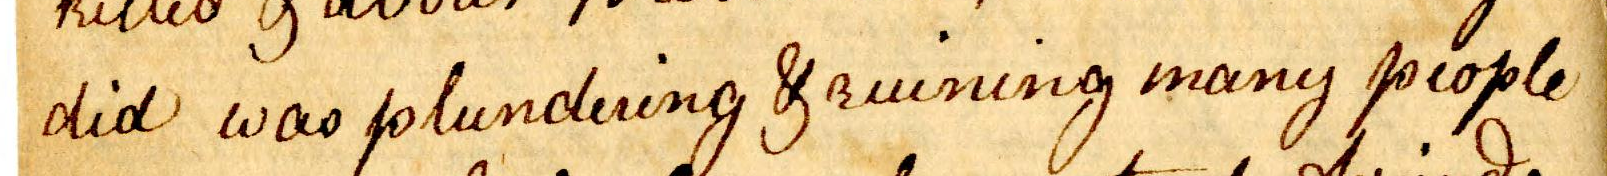did was plundering & ruining many people
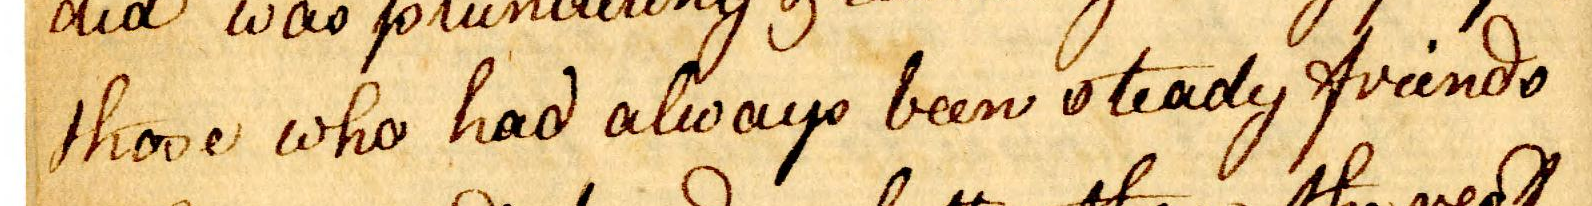those who had always been steady friends
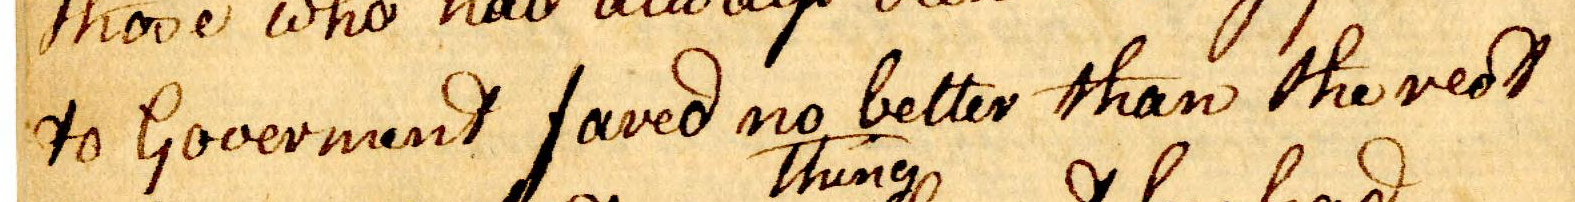to Goverment fared no better than the rest
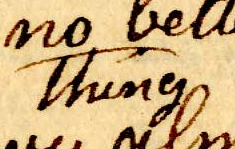thing
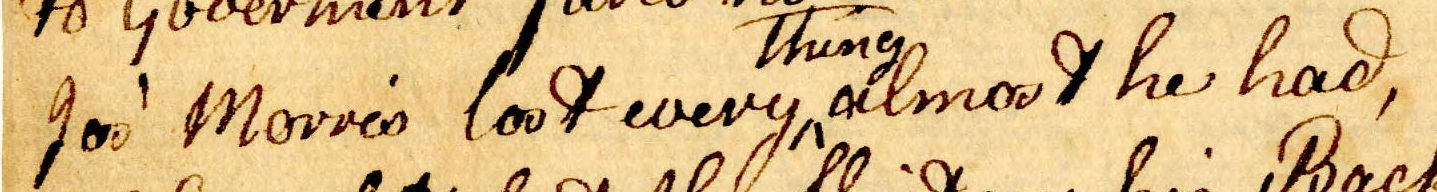Jos' Morris lost every ^almost he had,
